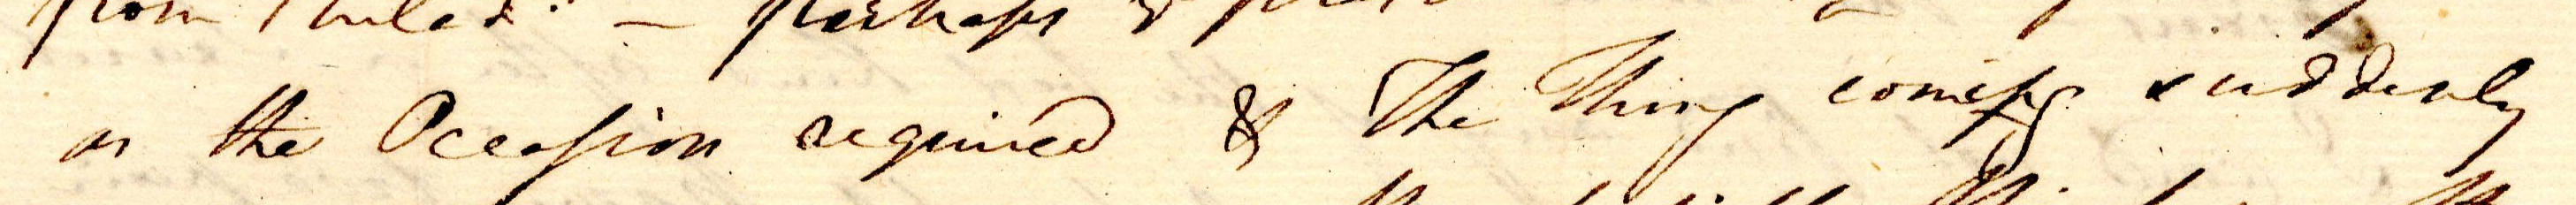on the Occasion required & the Thing coming suddenly
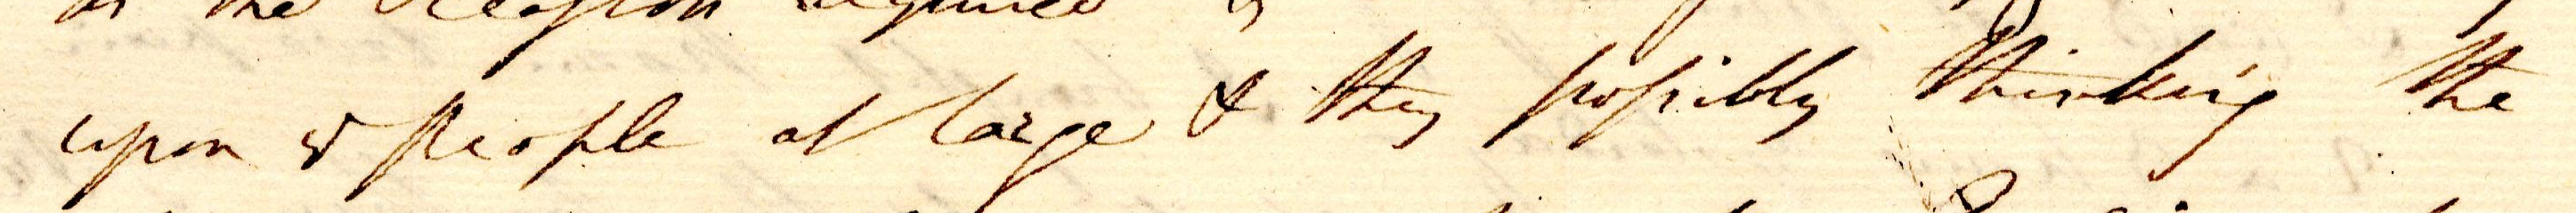upon y^e people at large & they possibly thinking the
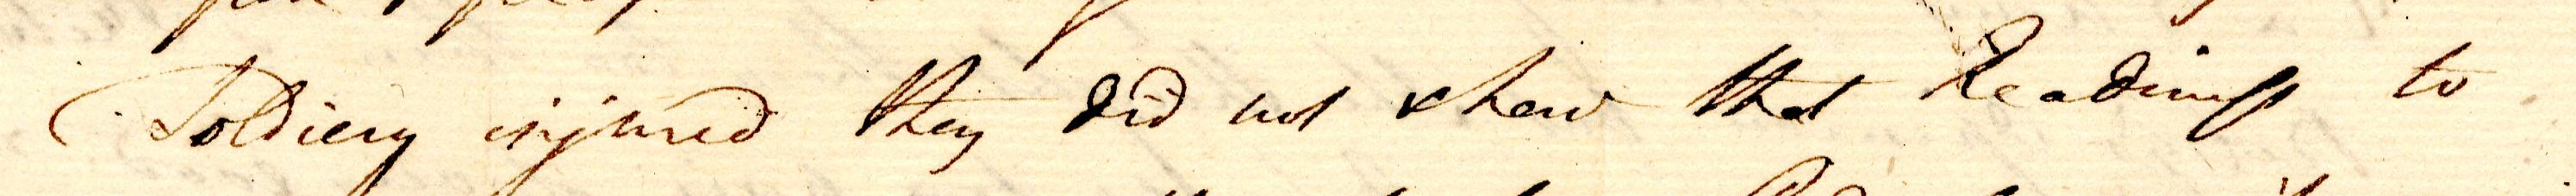Soldiery injured they did not shew that Readiness to
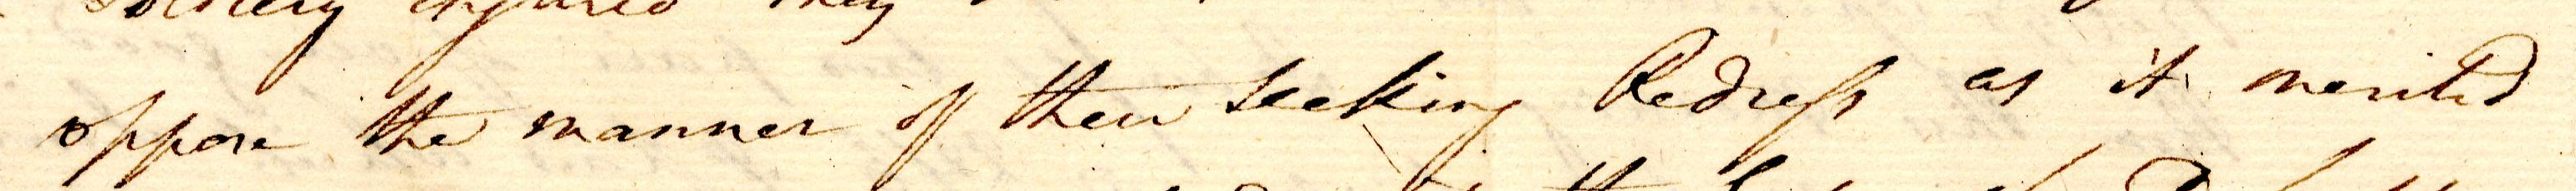oppose the manner of then Seeking Redress as it merited
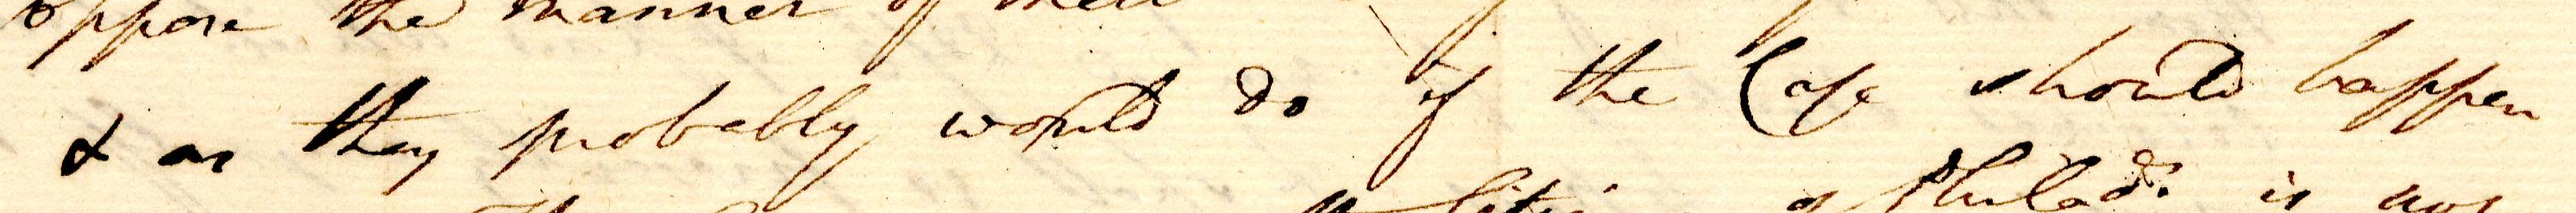& as they probably would do if the Case should happen
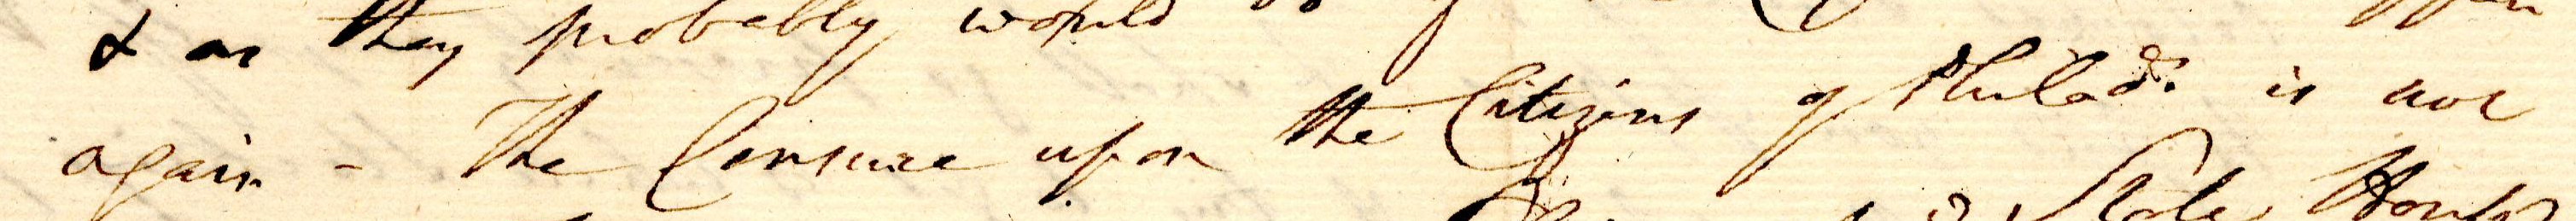again. The Censure upon the Citizens of Philad^a. is not
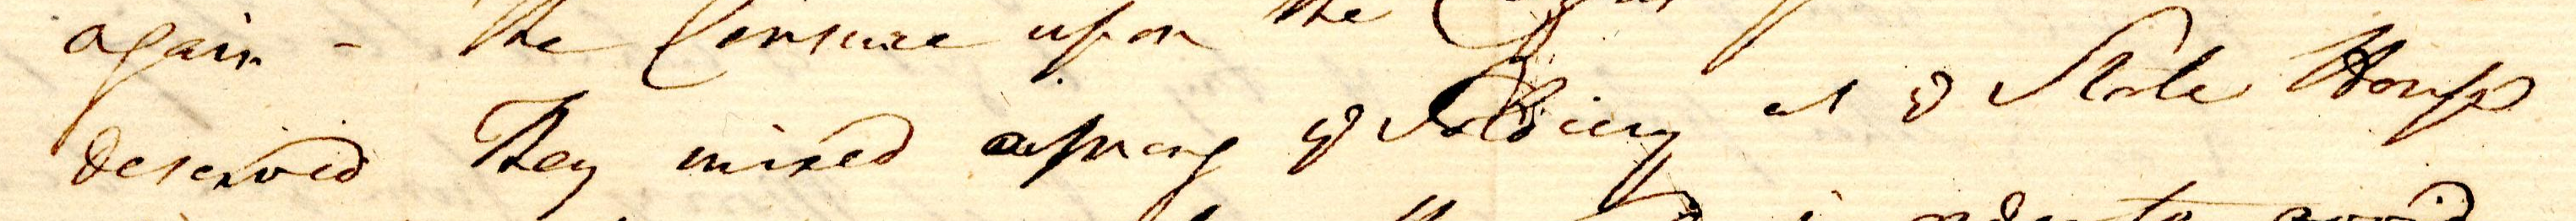deserved. They mixed among y^e Soldiery at y^e State Houses
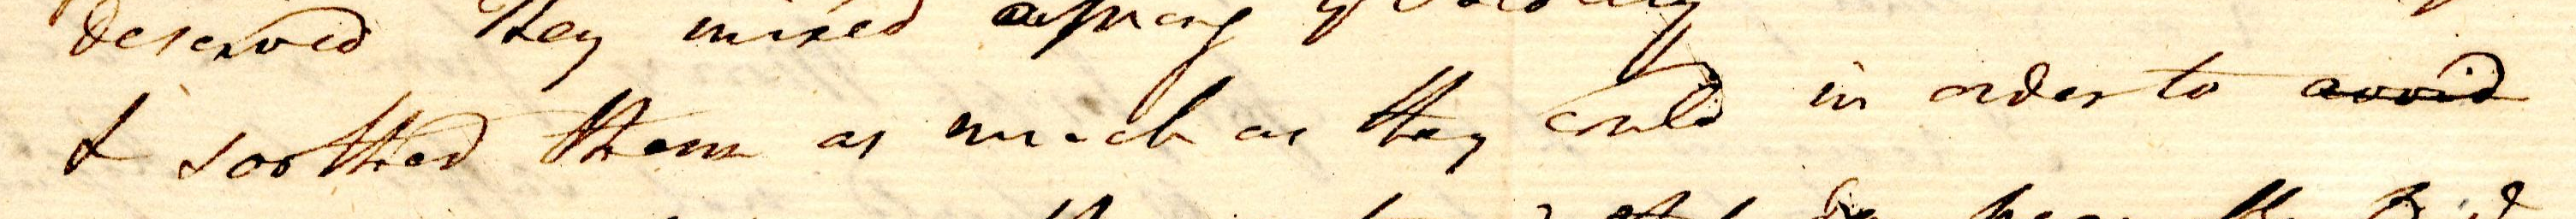& soothed them as much as they could in order to avoid
